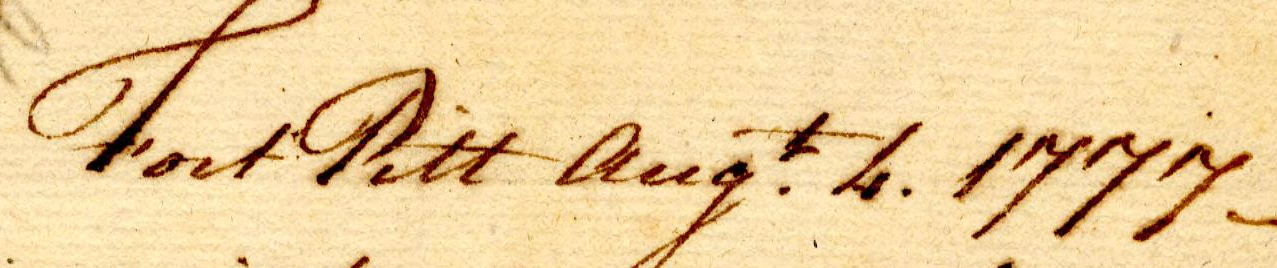Fort Pitt Aug^t. 4. 1777-
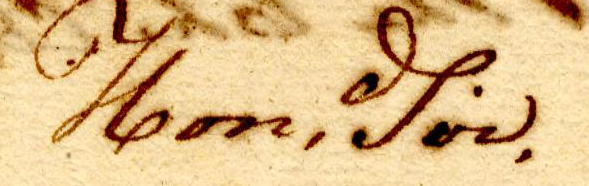Hon. Sir,
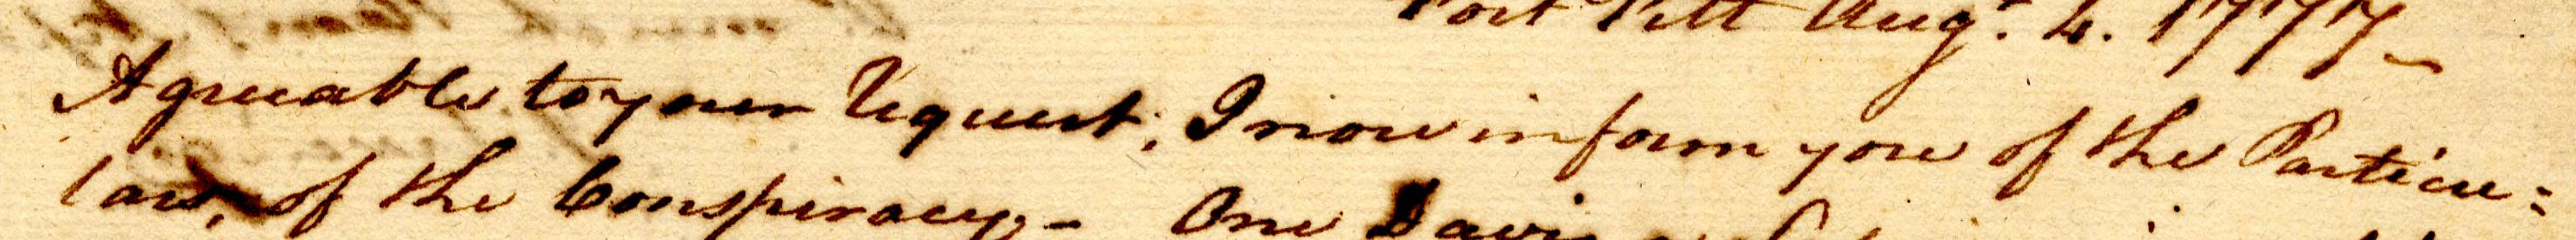Agreeable to your Request; I now inform you of the Particu-
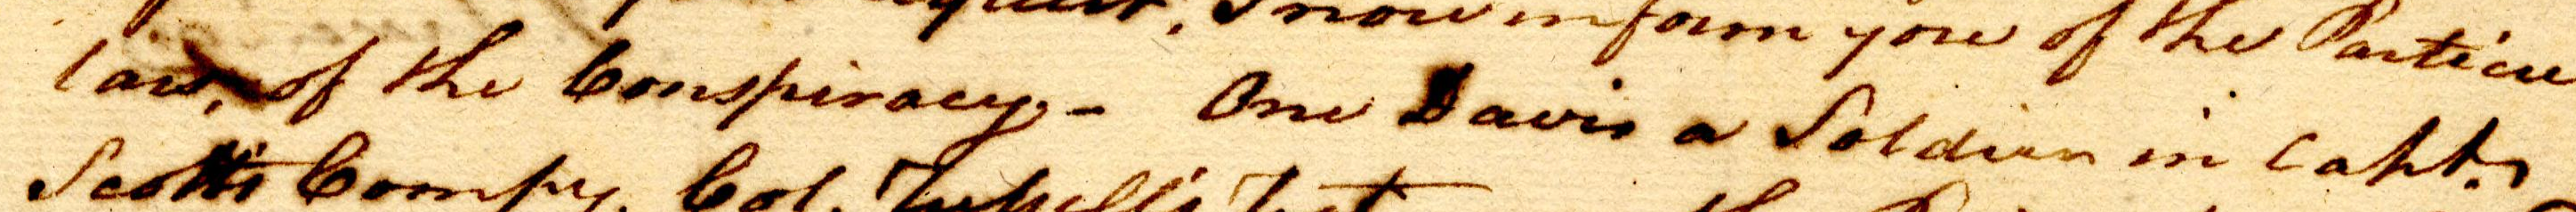lars, of the Conspiracy- One Davis a Soldier in Capt.
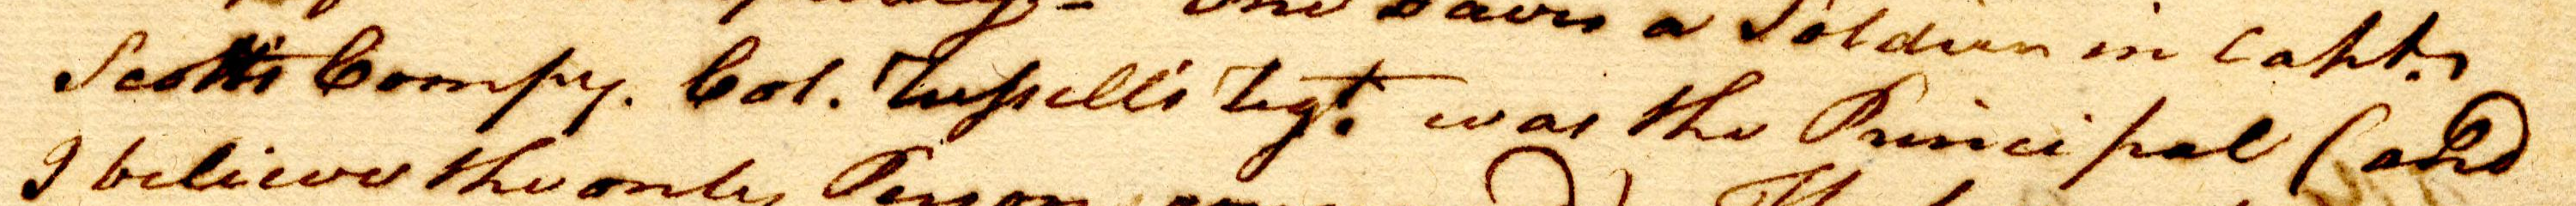Scott's Compy. Col. Russell's Regt. was the Principal (and
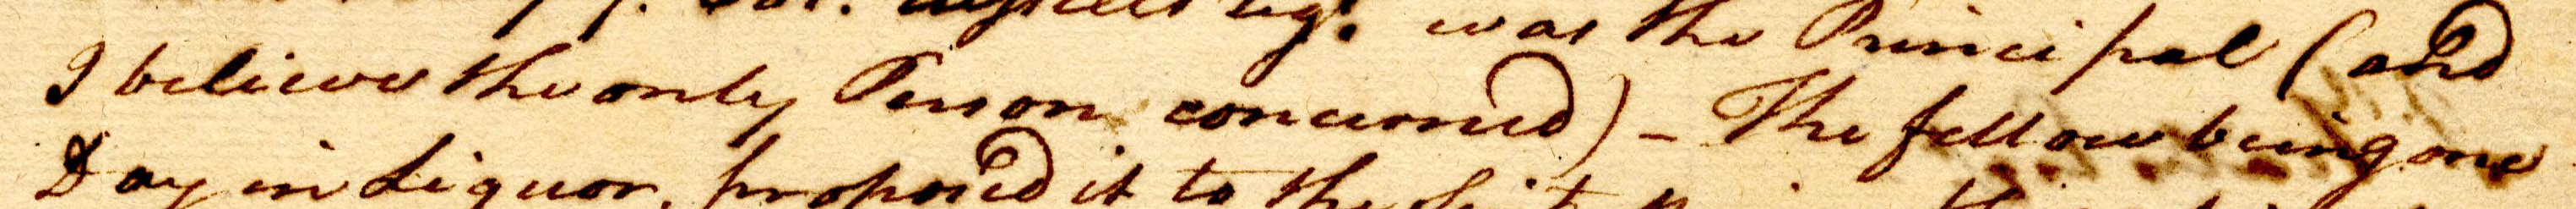I believe the only Person concerned)- The fellow being one
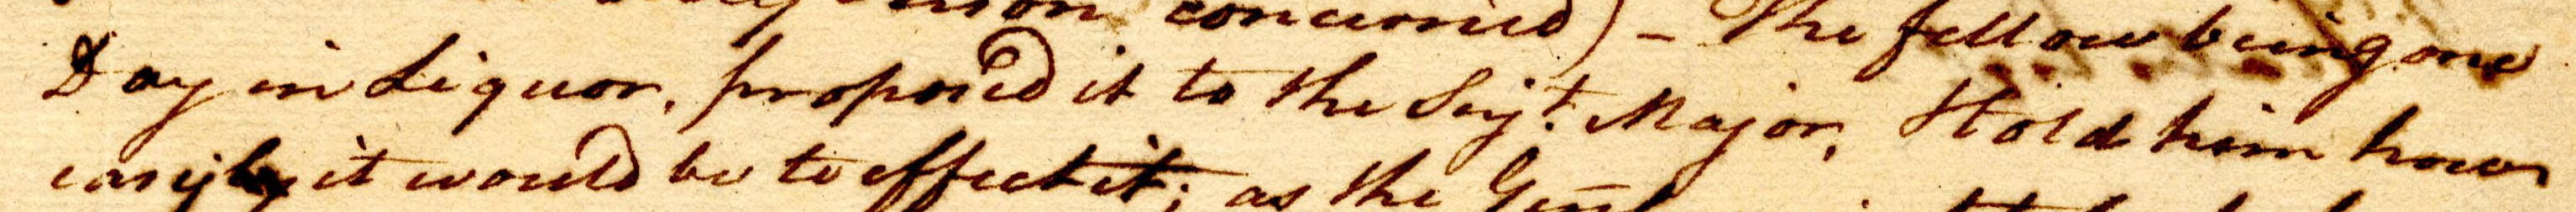Day in Liquor, proposed it to the Serj^t. Major. & told him how
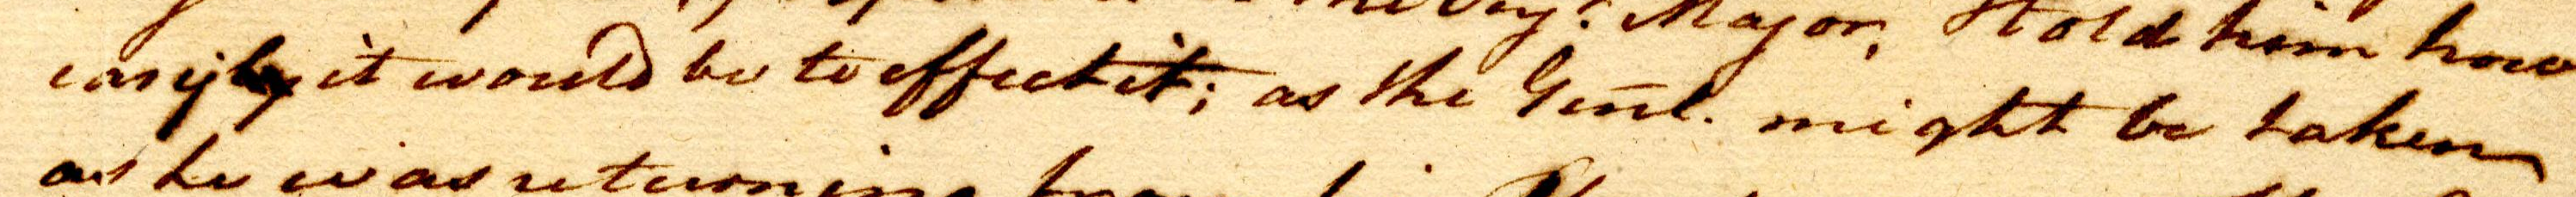easy [__] it would be to affect it; as the Gen̄l might be taken
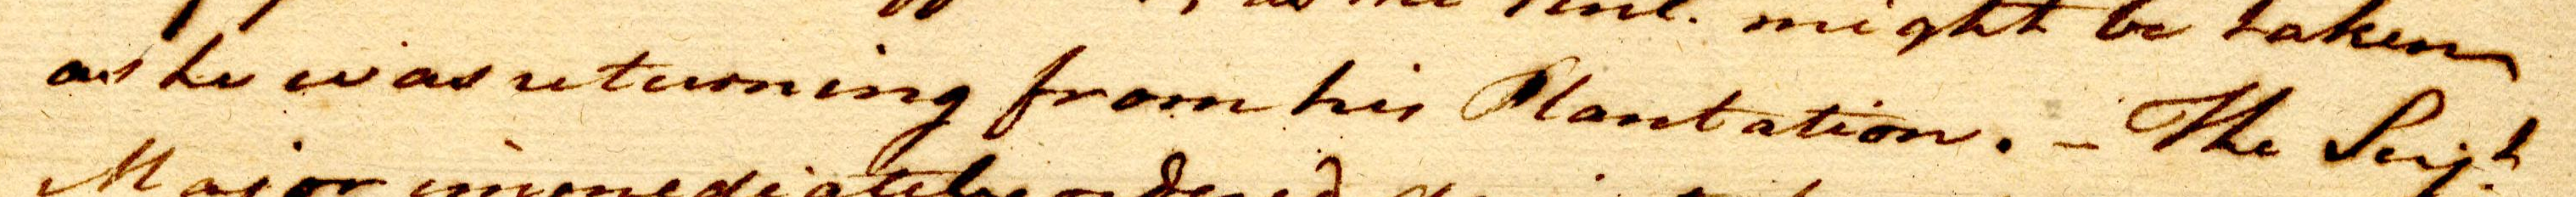as he was returning from his Plantation.- The Serj^t.
